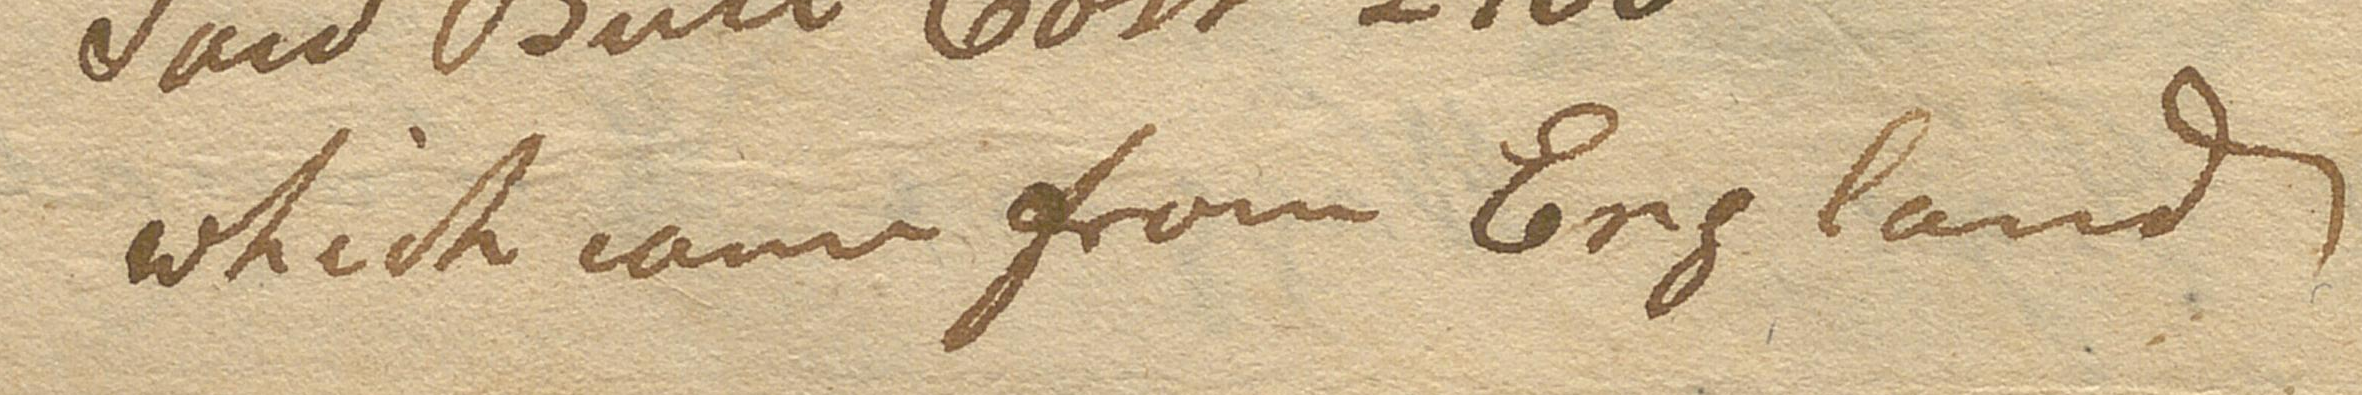which came from England
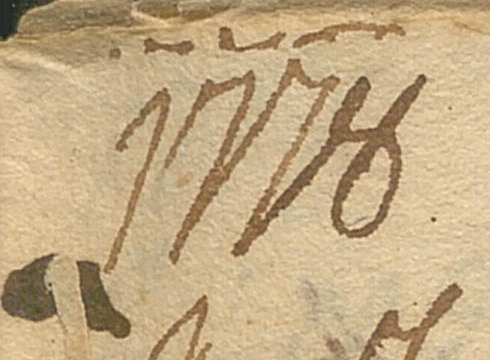1778
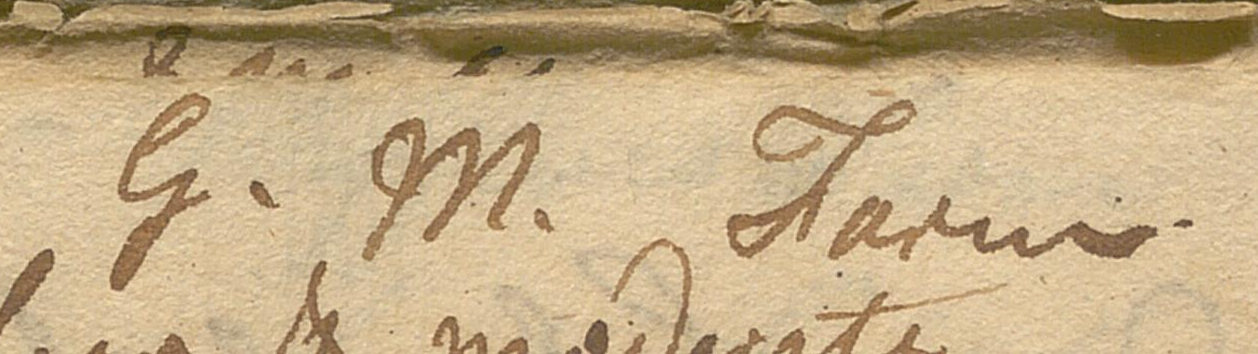G. M. Farm
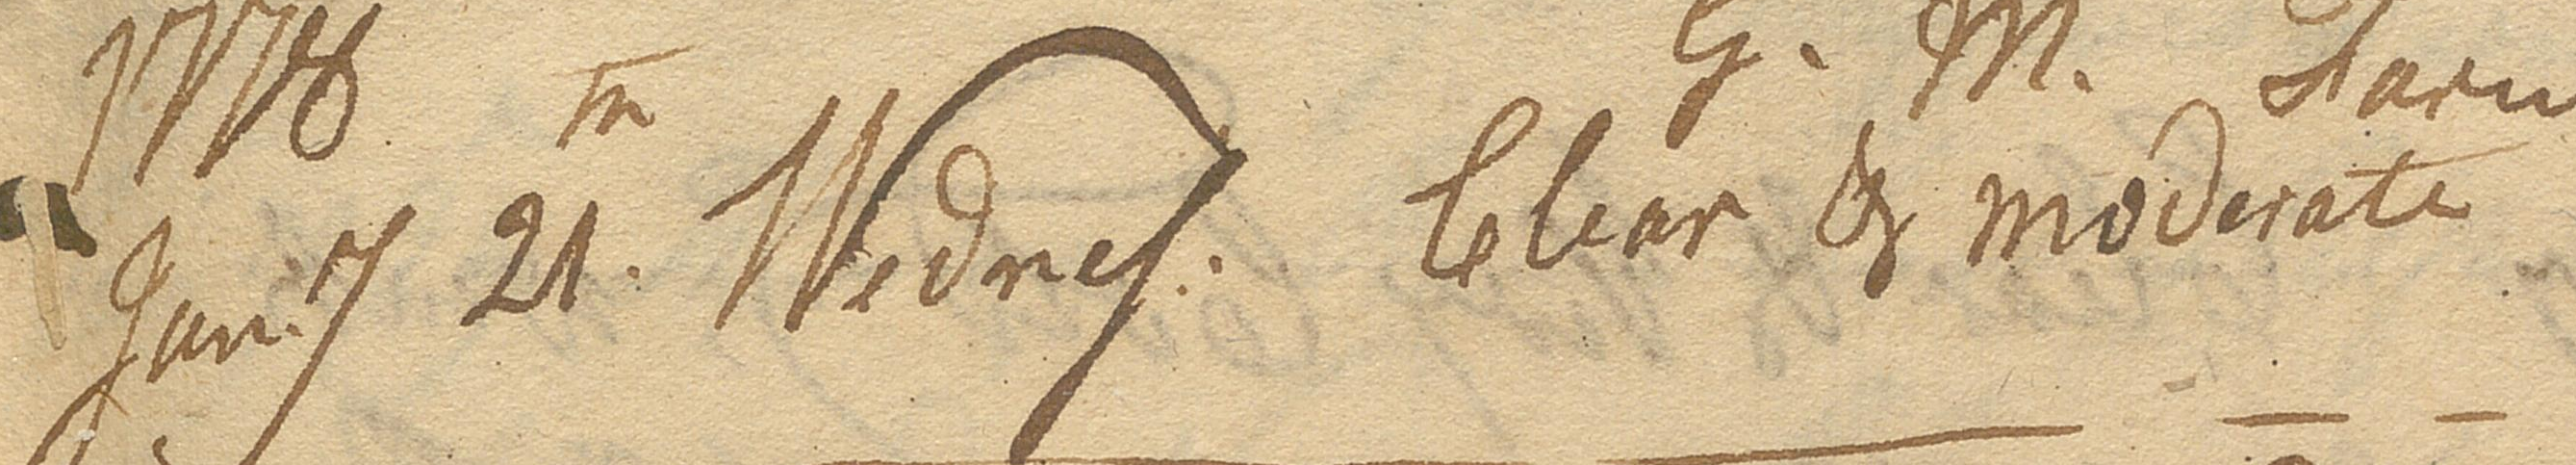Jan^y. 21^th. Wednes. Clear & modenate
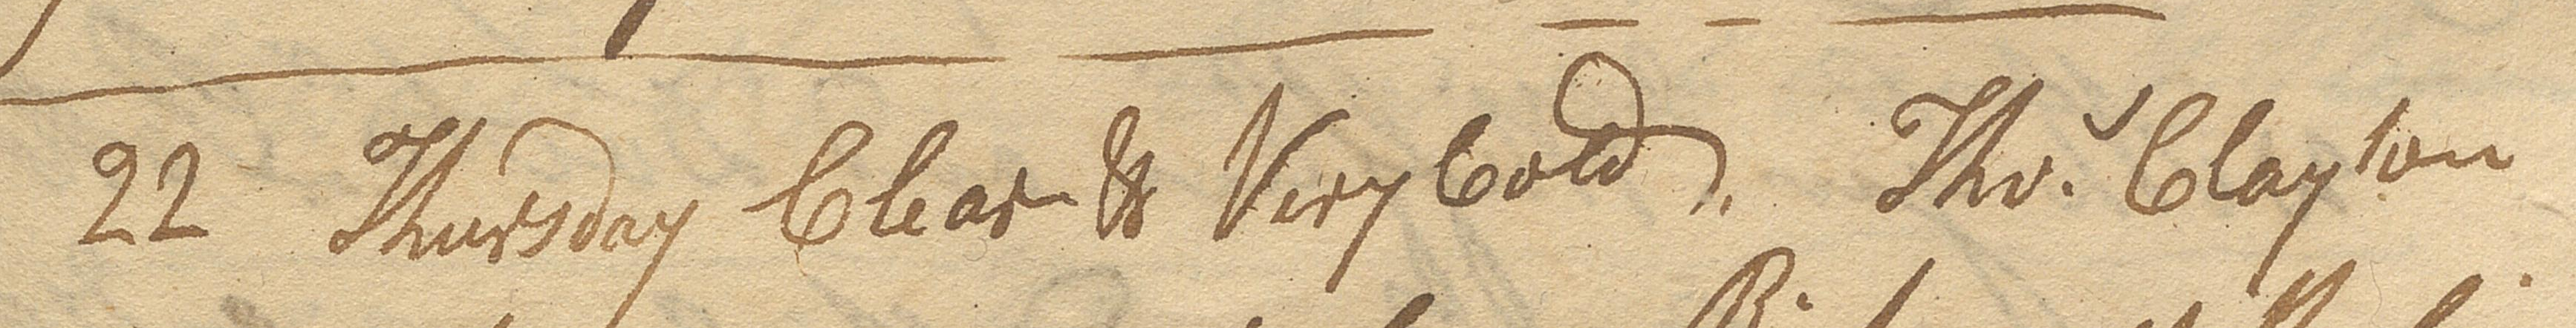22 Thursday Clear & Very Cold. Tho^s. Clayton
